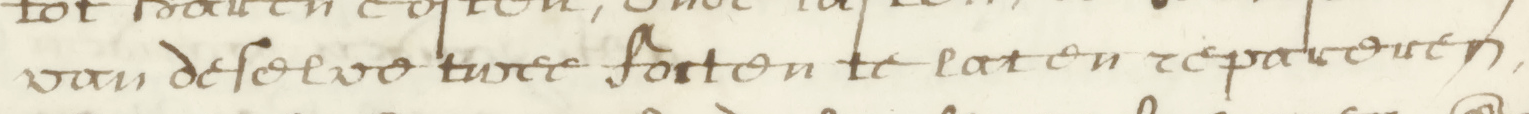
van deselve twee forten te laten repareren,
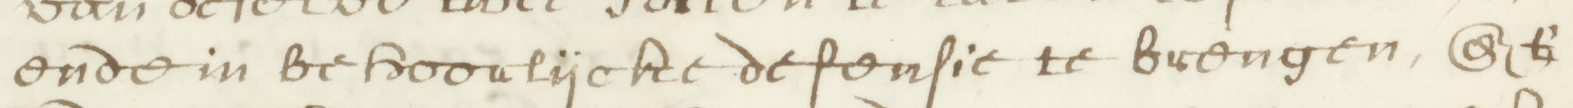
ende in behoorlijcke defensie te brengen, & t‛
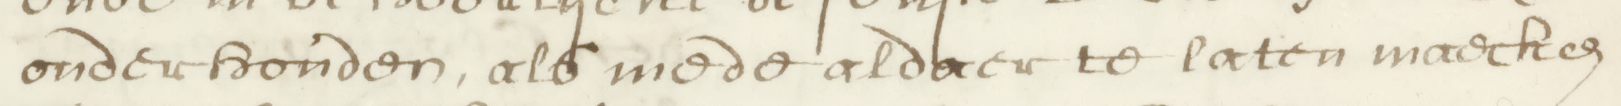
onderhouden, als mede aldaer te laten maecken
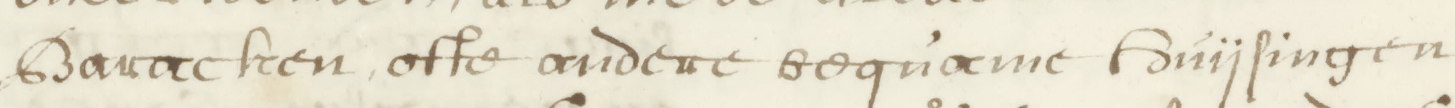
Baracken, ofte andere bequame Huijsingen
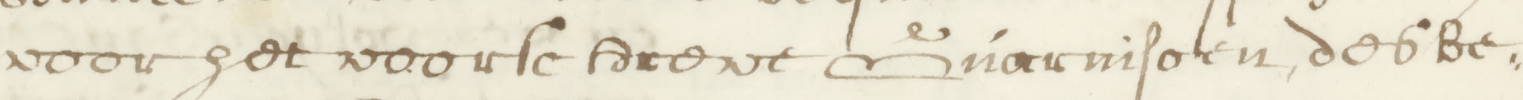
voor het voorschreve Guarnisoen, des be„
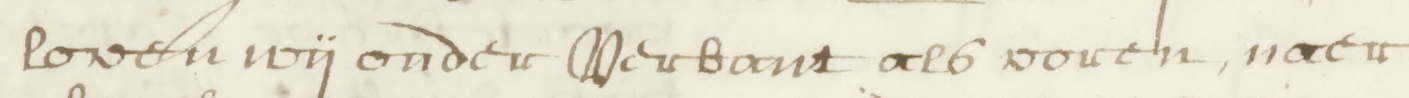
loven wij onder Verbant als voren, naer
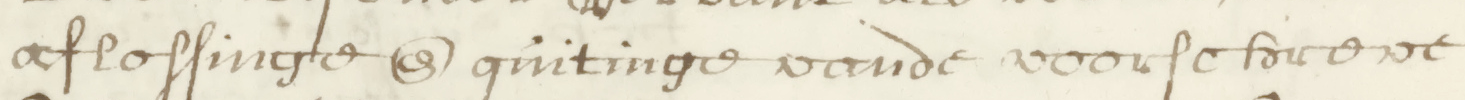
aflossinge & quitinge vande voorschreve
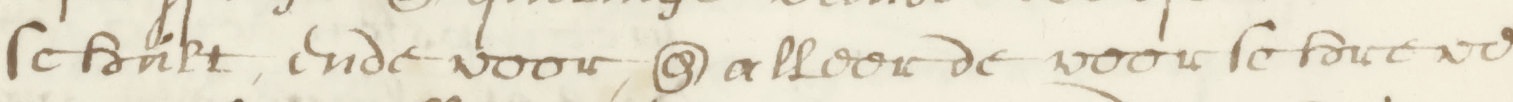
schult ende voor, & alleer de voorschreve
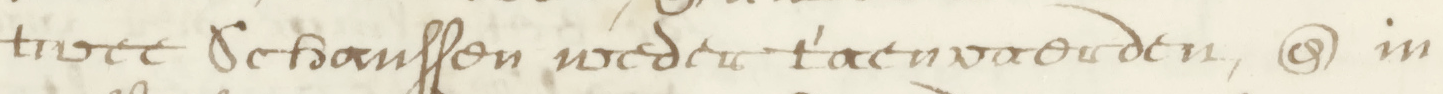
twee Schanssen weder t'aenvaerden, & in
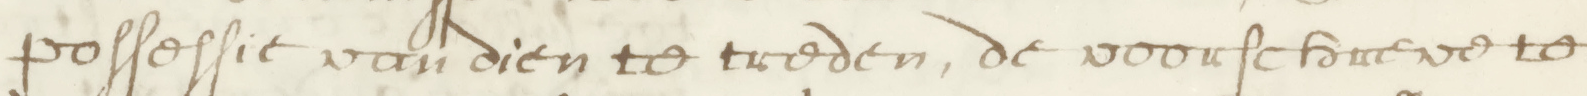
possessie van dien te treden, de voorschreve te
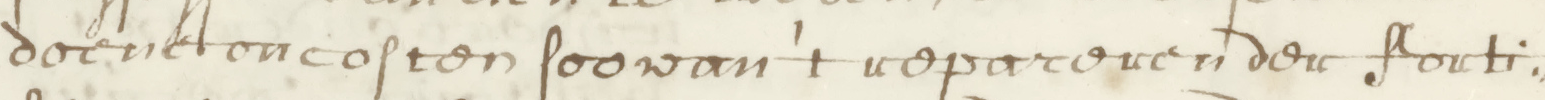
doene oncosten soo van 't repareren der forti„
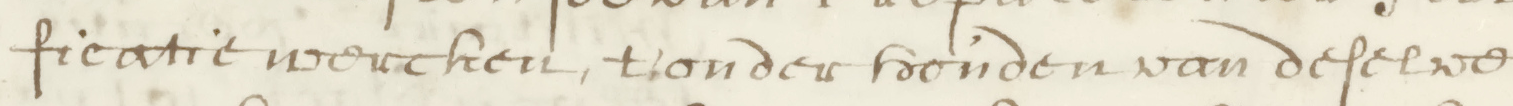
ficatie wercken, t‛onderhouden van deselve
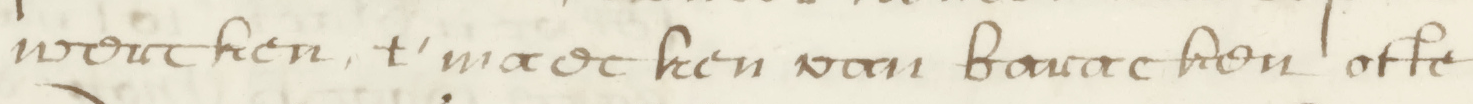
wercken, t'maecken van baracken ofte
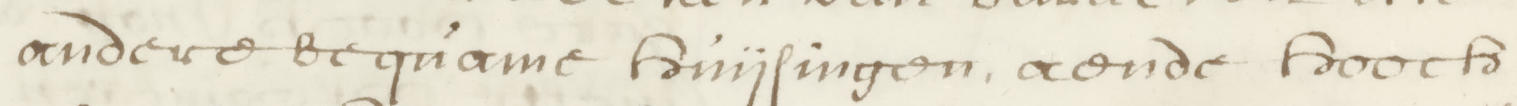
andere bequame huijsingen, aende hooch
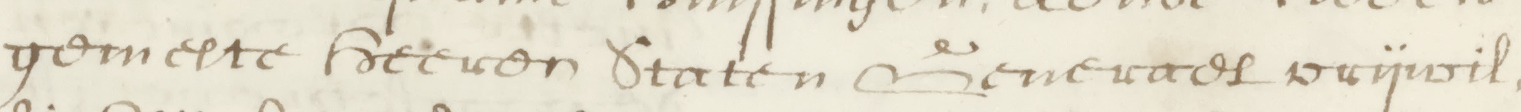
gemelte heeren Staten Generael vrijwil„
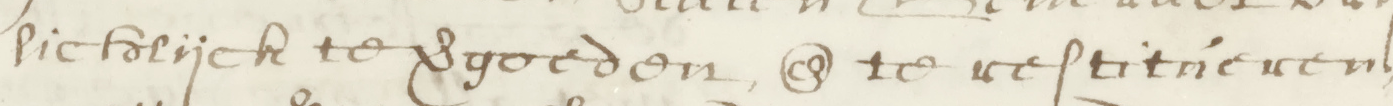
lichlijck te vgoeden, & te restitueren,
